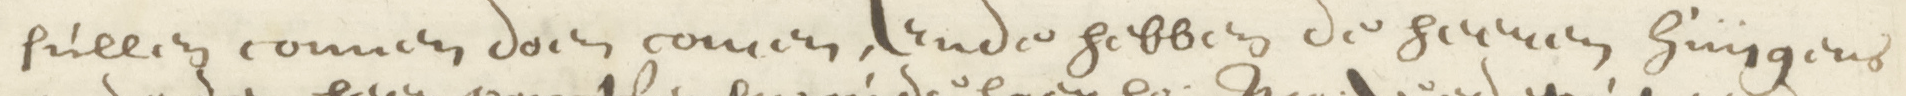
sullen connen doen comen, Ende hebben de heeren huijgens
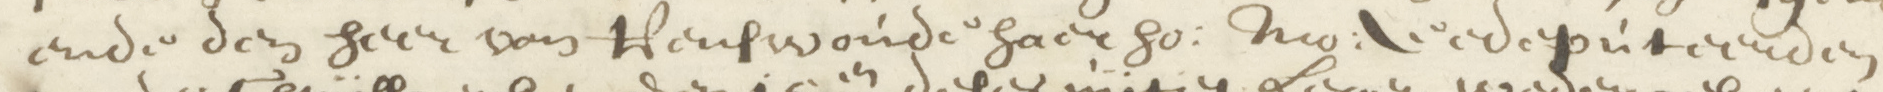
ende den heer van Renswoude haer ho:Mo: Gedeputeerden
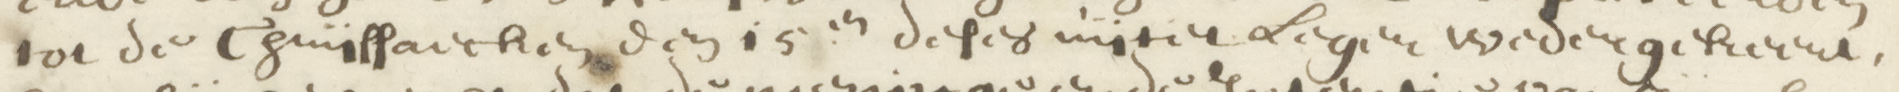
tot de Chuijssaecken den 15en deses uijtet Leger wedergekeert,
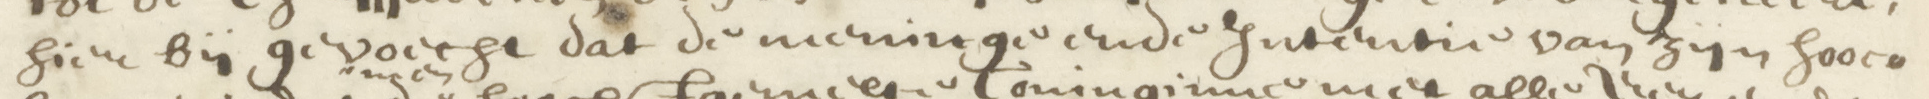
hier bij gevoecht dat de meninge ende Intentie van zijn hooc,,
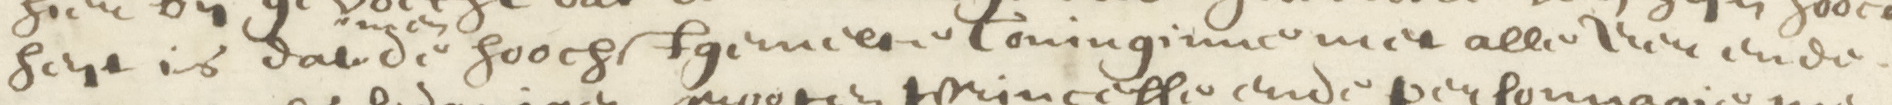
heyt is dat de hoochstgemelte Coninginne met alle Eer ende
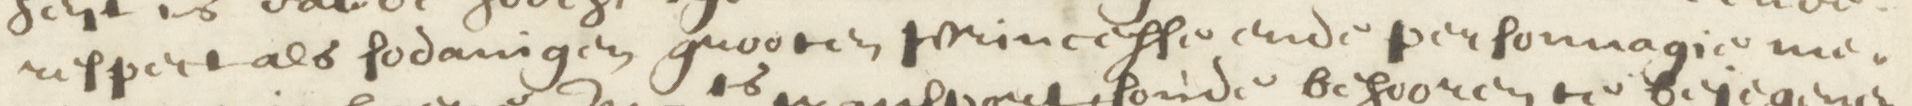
respect als sodanigen grooten Princesse ende personnagie me,,
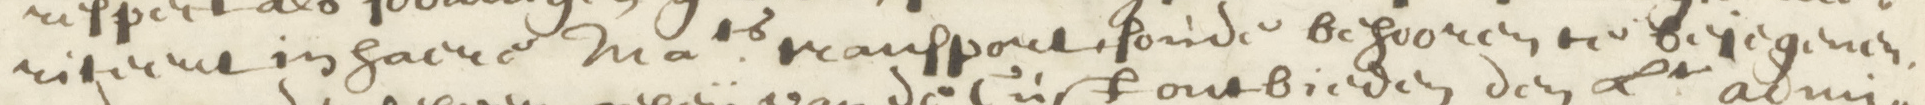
riteert in haere Mats. transport, soude behooren te bejegenen,
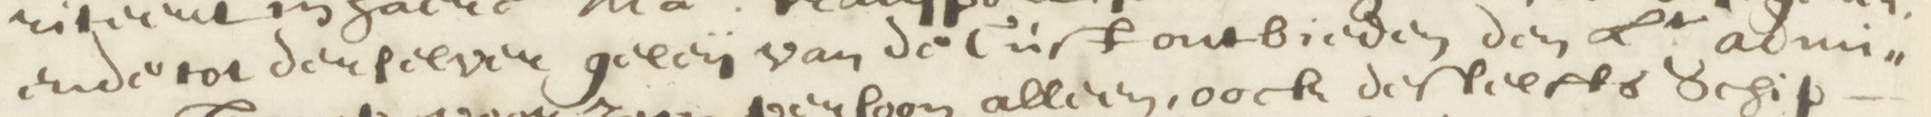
ende tot derselver geleij van de Cust ontbieden den Lt admi,,
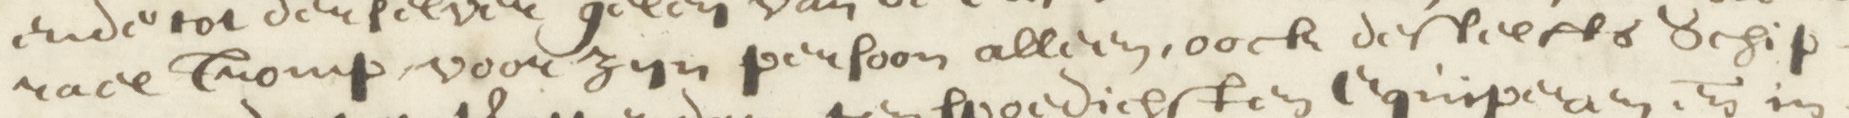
rael Tromp voor zijn persoon alleen, oock desselffs Schip
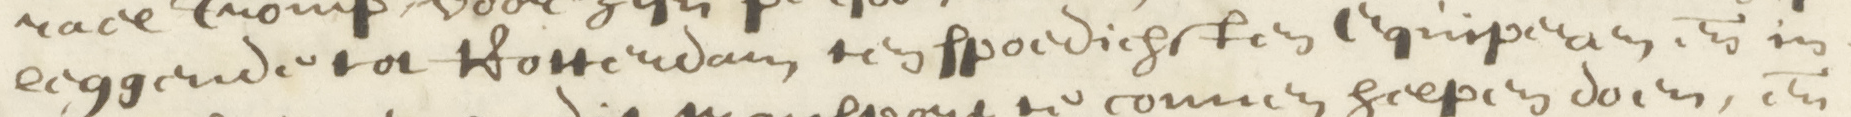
leggende tot Rotterdam ten spoedichsten Equiperen en in
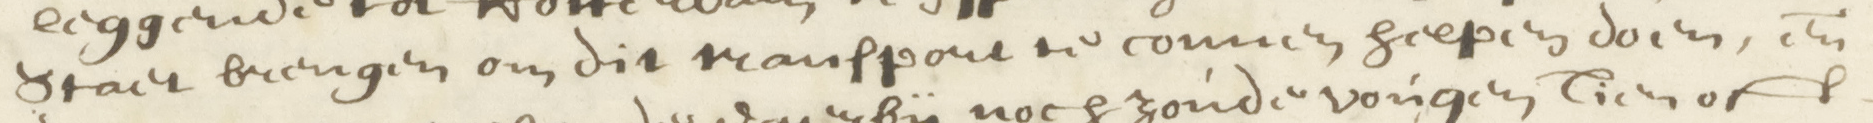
Staet brengen om dit transport te connen helpen doen, en
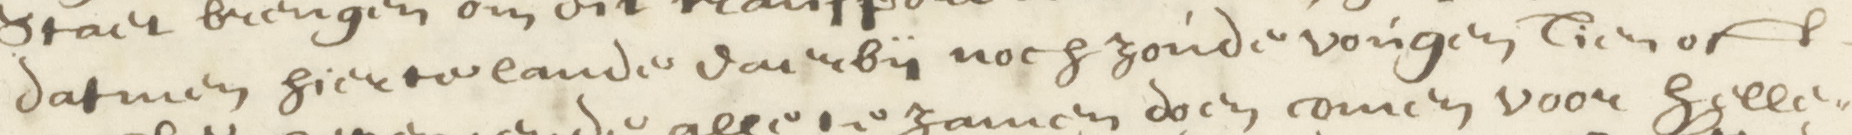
datmen hier te lande daerbij noch zoude vougen Tien off
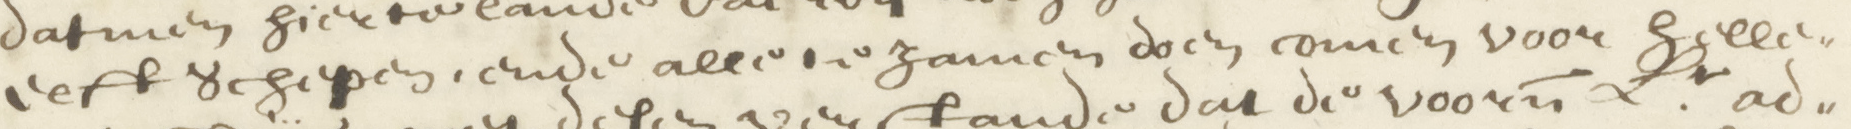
elff schepen, ende alle te zamen doen comen voor helle,,
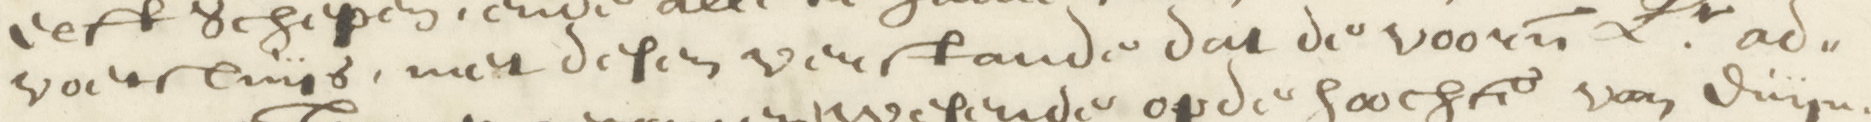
voetsluijs, met desen verstande dat de voorn Lt. ad,,
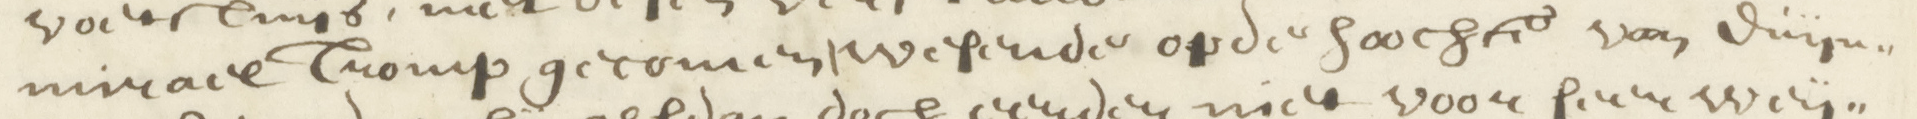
mirael Tromp gecomen, wesende opde hoochte van Duijn,,
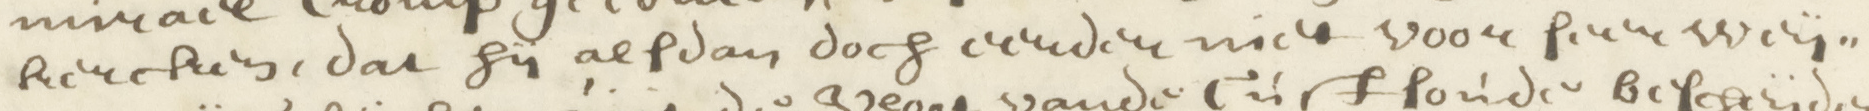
kercken, dat hij alsdan doch eerder niet voor seer weij,,
